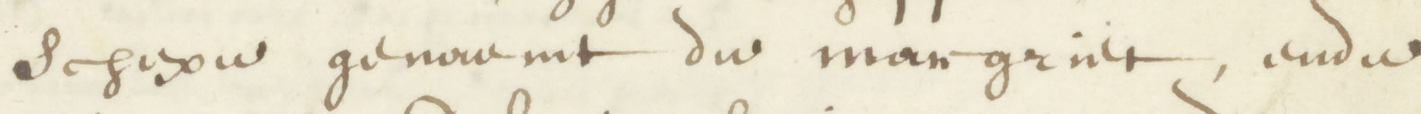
Schepe genaemt de margriet, ende
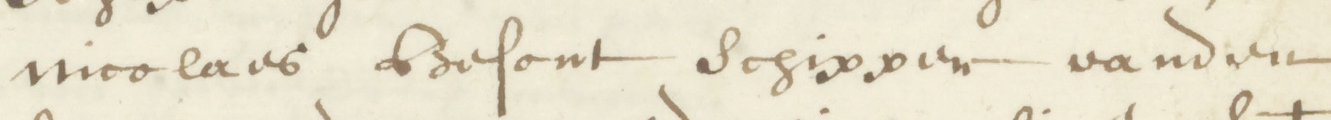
Nicolaes Besont Schipper vanden
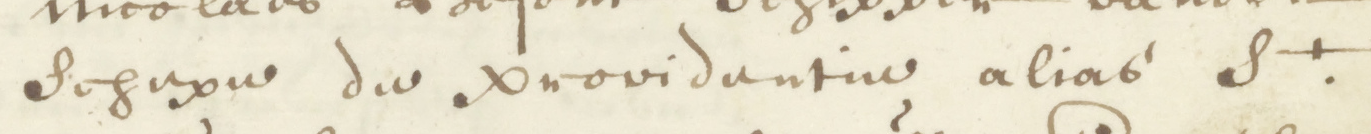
Schepe de providentie alias St.
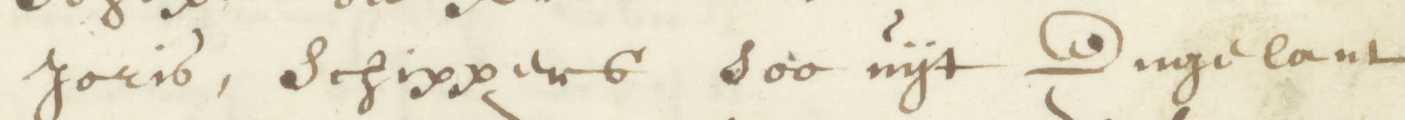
Joris, Schippers soo uijt Engelant
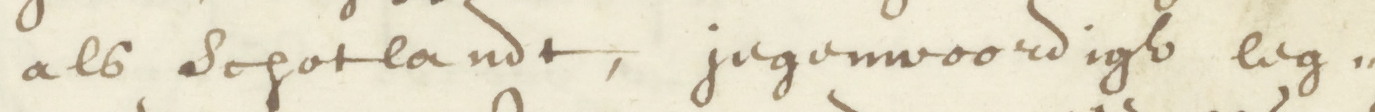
als Schotlandt, jegenwoordigh leg„
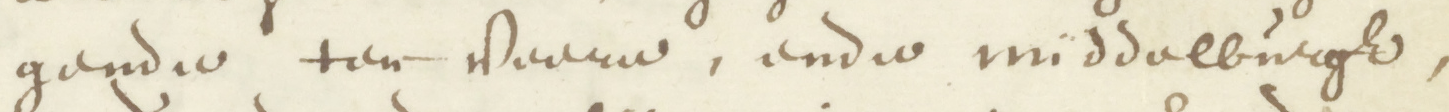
gende ter Veere, ende middelburgh,
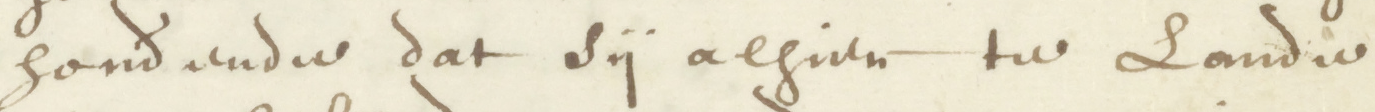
houdende dat sij alhier te Lande
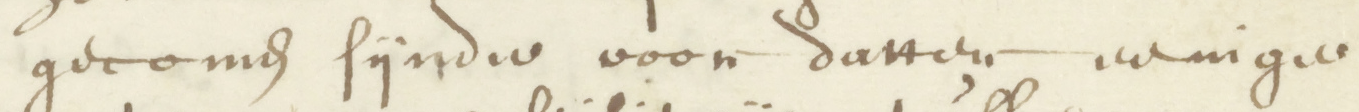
gecomen sijnde voor datter eenige
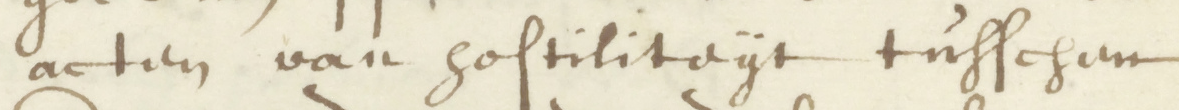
acten van hostiliteijt tusschen
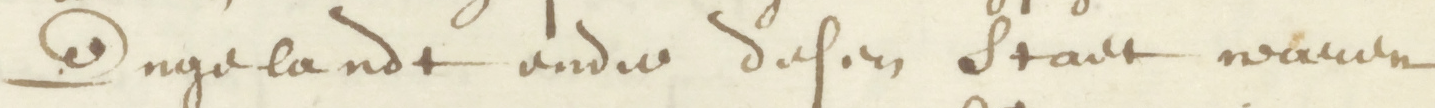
Engelandt ende desen Staet waren
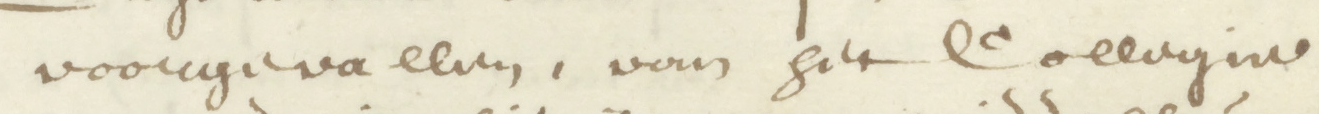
voorgevallen, van het Collegie
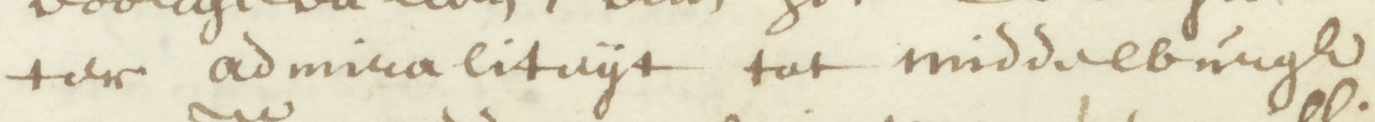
ter Admiraliteijt tot middelburgh
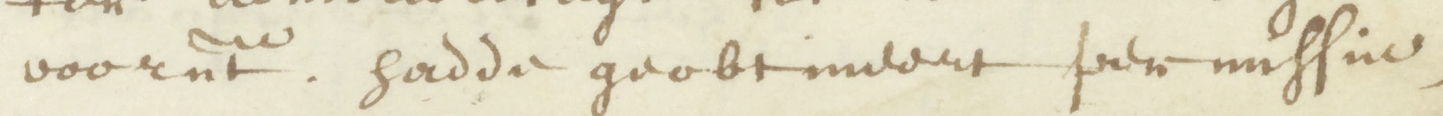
voornt, hadde geobtineert permissie,
